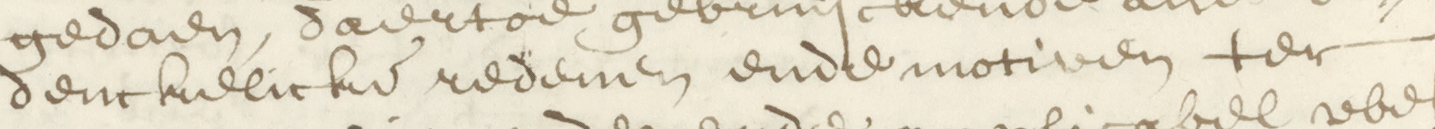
denckelicke redenen ende motiven ter
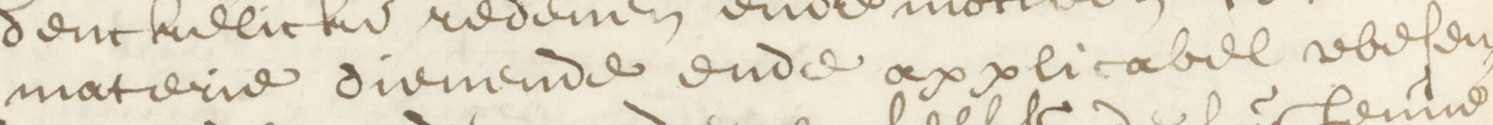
materie dienende ende applicabel wesen„
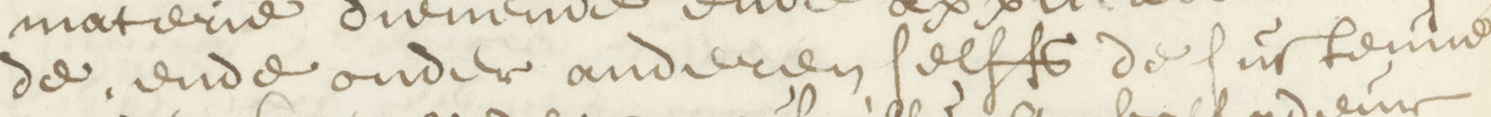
de, ende onder anderen selffs de sustenue
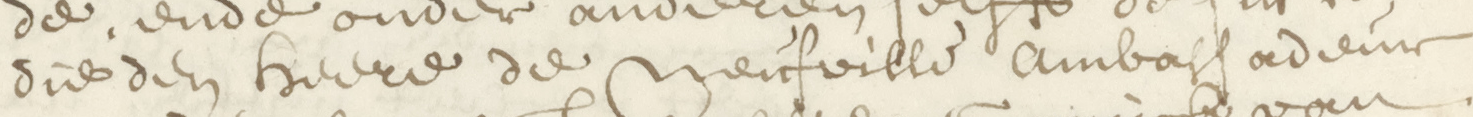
die den heere de Neusville Ambassadeur
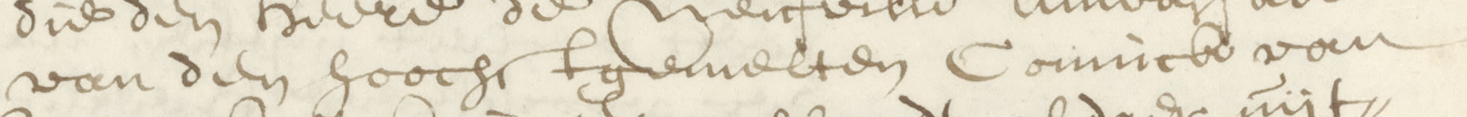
van den hoochstgemelten Coninck van
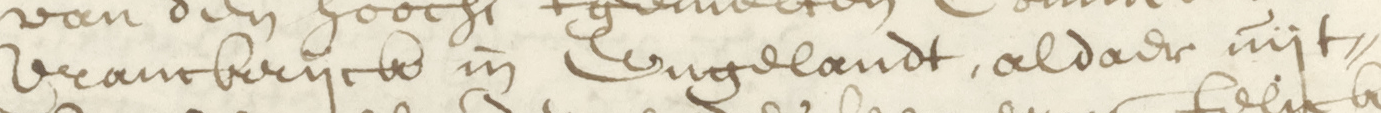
Vranckrijck in Engelandt, aldaer uijt„
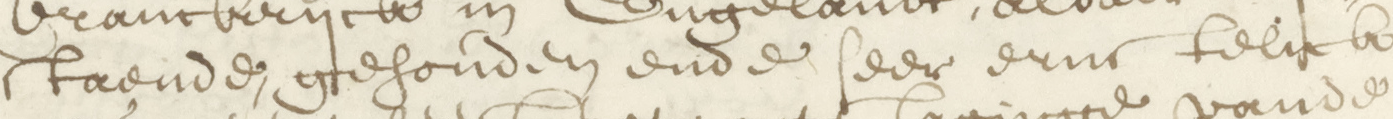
staende, gehouden ende seer ernstelick
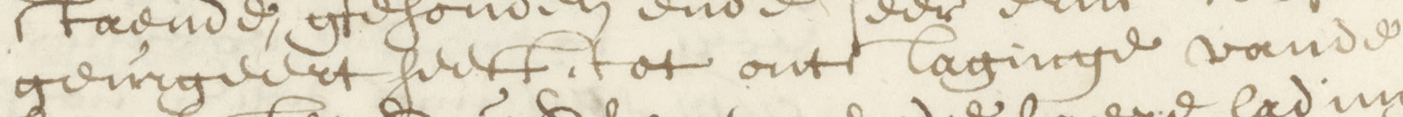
geurgeert heeft, tot ontslaginge vande
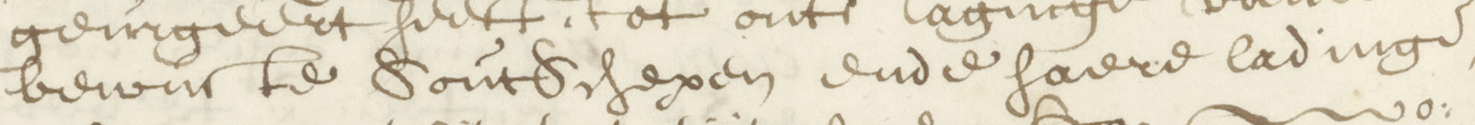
bewuste Soutschepen ende haere ladinge,
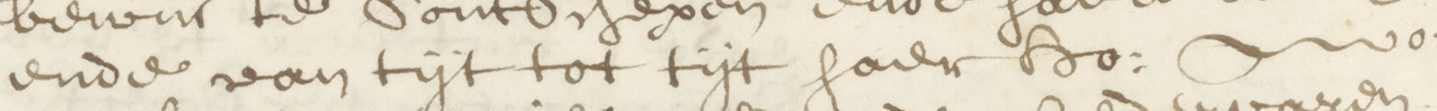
ende van tijt tot tijt haer Ho:Mo:
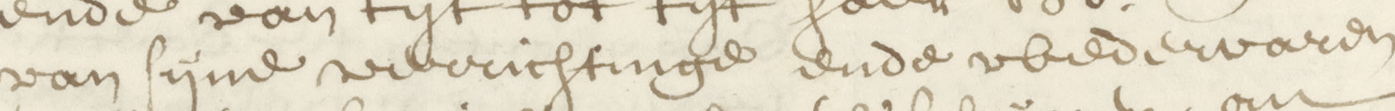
van sijne verrichtinge ende wedervaren
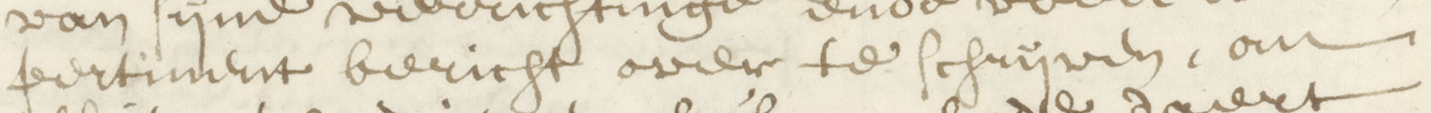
pertinent bericht over te schrijven, om
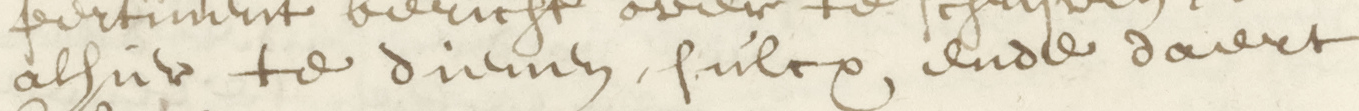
alhier te dienen, sulcx ende daert
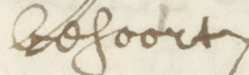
behoort.
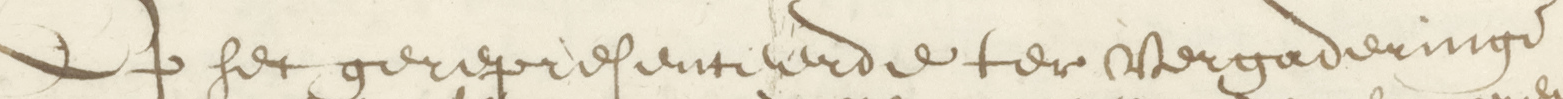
Op het gerepresenteerde ter Vergaderinge
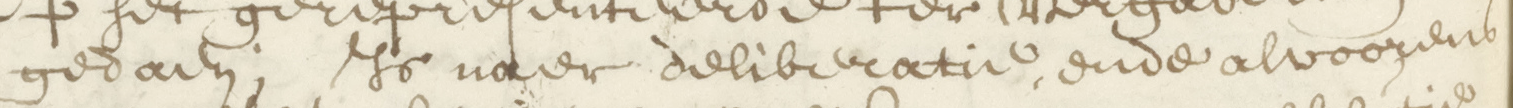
gedaen; Is naer deliberatie, ende alvoorens
